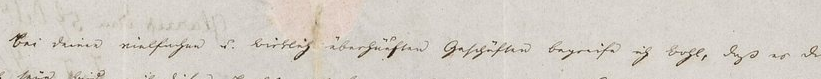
Bei deinen vielfachen u. wirklich überhäuften Geschäften begreife ich wohl, daß es Dir
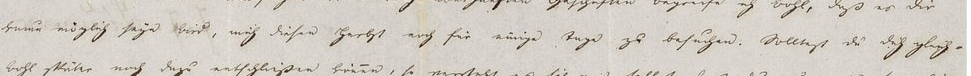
kaum möglich seyn wird, mich diesen Herbst noch für einige Tage zu besuchen. Solltest Du Dich gleich-
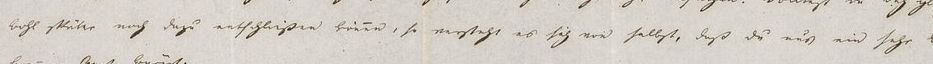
wohl später noch dazu entschließen können, so versteht es sich von selbst, daß Du uns ein sehr
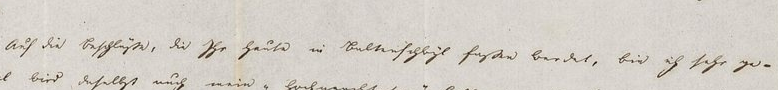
Auf die Beschlüße, die Ihr heute in Baltenschwyl faßen werdet, bin ich sehr ge-
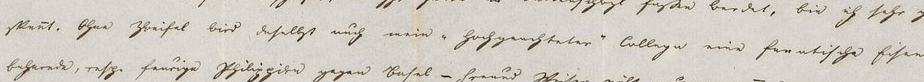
spannt. Ohne Zweifel wird daselbst auch mein «hochgeachteter» College eine frenetische Eisen-
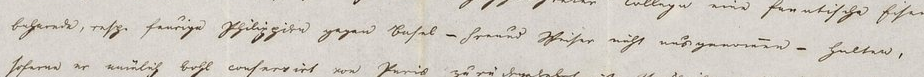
bahnrede, resp. feurige Philippika gegen Basel – Freund Speiser nicht ausgenommen – halten,
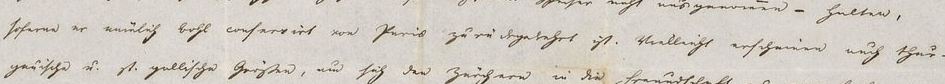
soferne er nämlich wohl conservirt von Paris zurückgekehrt ist. Vielleicht erscheinen auch thur-
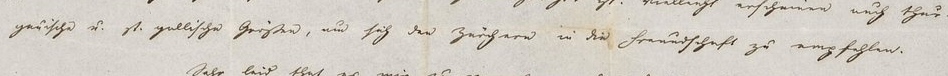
gauische u. st. gallische Größen, um sich den Zürchern in die Freundschaft zu empfehlen.
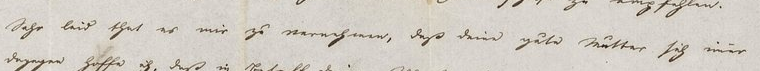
Sehr leid thut es mir zu vernehmen, daß Deine gute Mutter sich immer
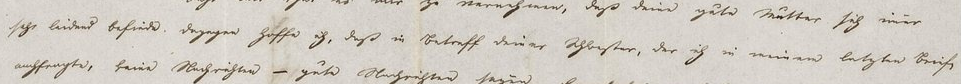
sehr leidend befinde. Dagegen hoffe ich, daß in Betreff Deiner Schwester, der ich in meinem letzten Briefe
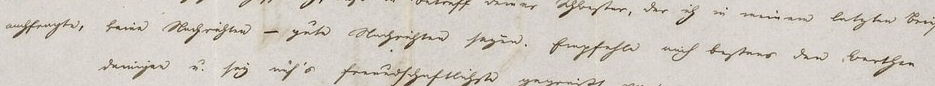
nachfragte, keine Nachrichten – gute Nachrichten seyen. Empfehle mich bestens den werthen
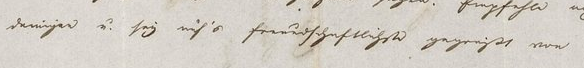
Deinigen u. sey auf's freundschaftlichste gegrüßt von
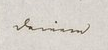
Deinem
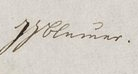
J J Blumer.
